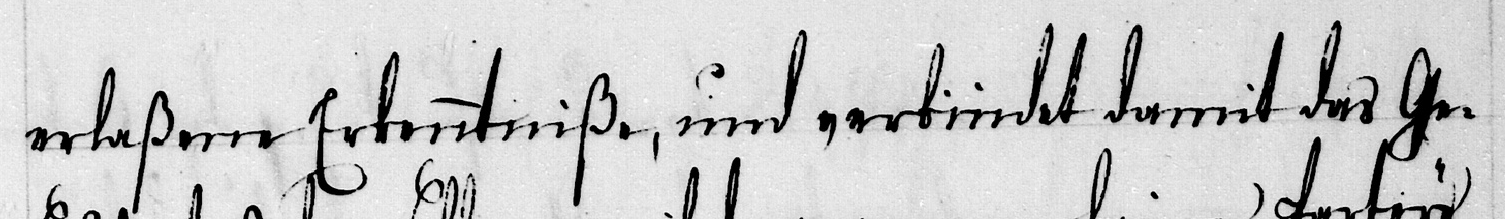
erlaßene Erkenntniße, und verbindet damit das Ge¬
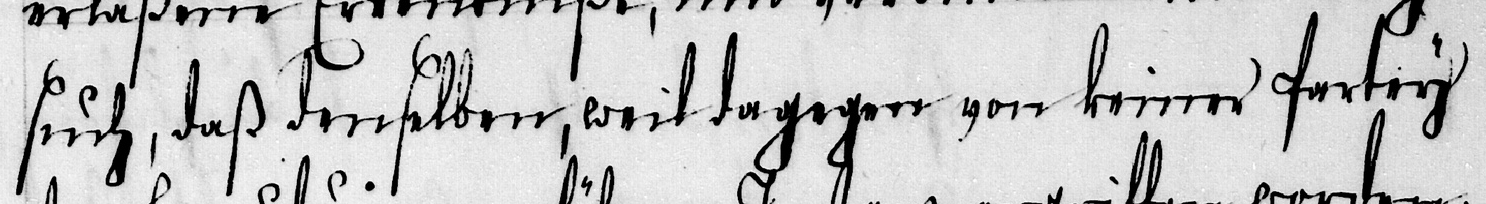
such, daß denselben, weil dagegen von keiner Partey
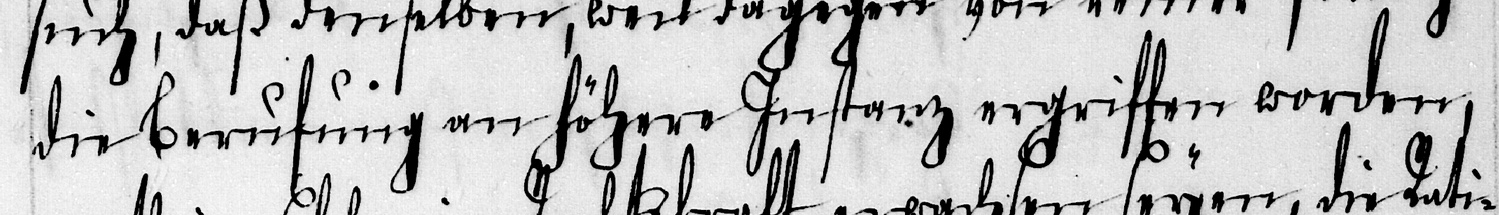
die Berufung an höhere Instanz ergriffen worden,
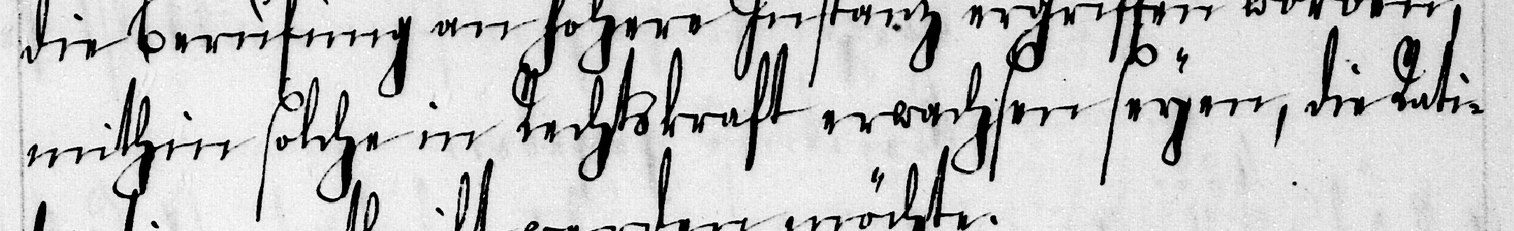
mithin solche in Rechtskraft erwachsen seyen, die Rati¬
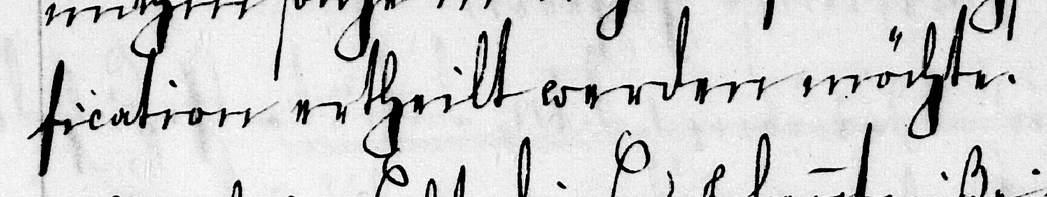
fication ertheilt werden möchte.
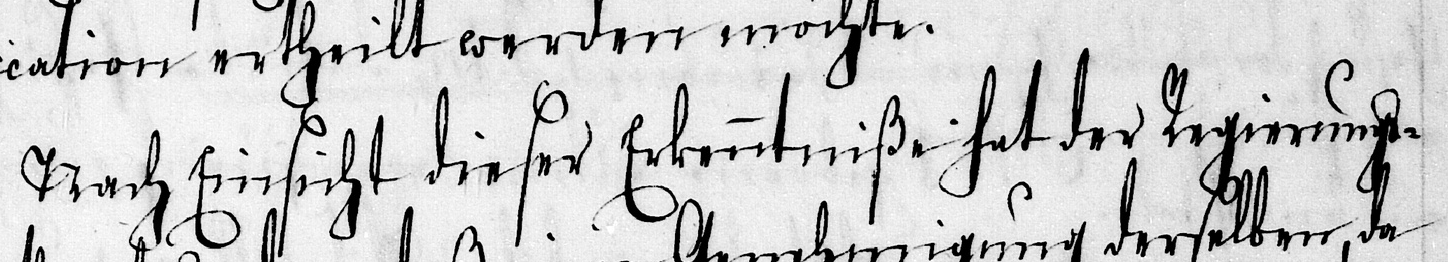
Nach Einsicht dieser Erkenntniße hat der Regierungs¬
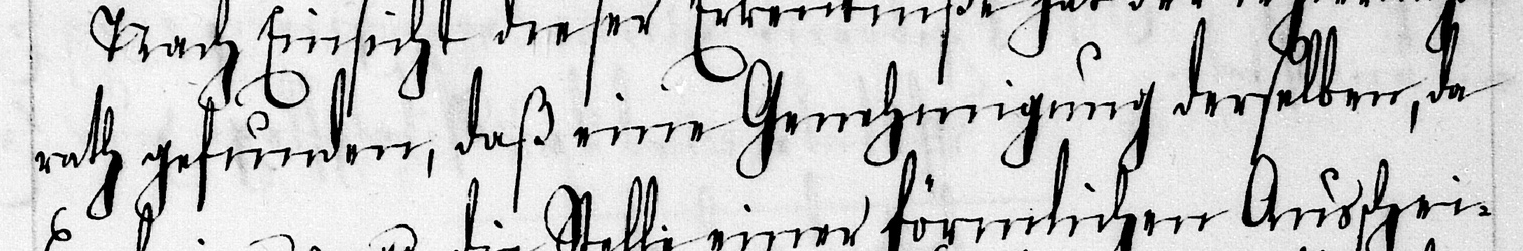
rath gefunden, daß eine Genehmigung derselben, da
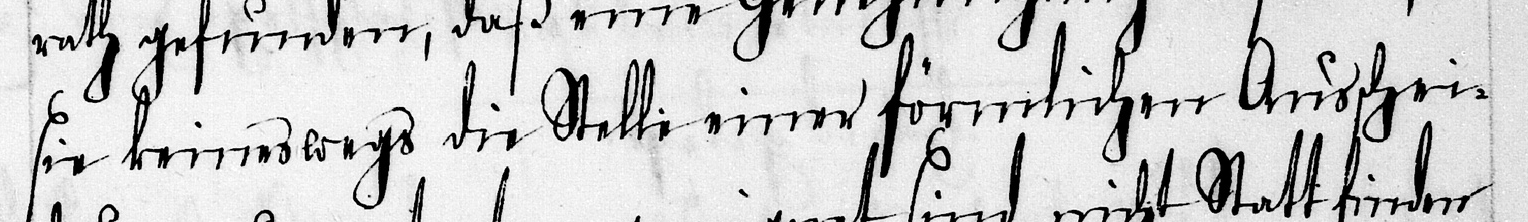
sie keineswegs die Stelle einer förmlichen Ausschei¬
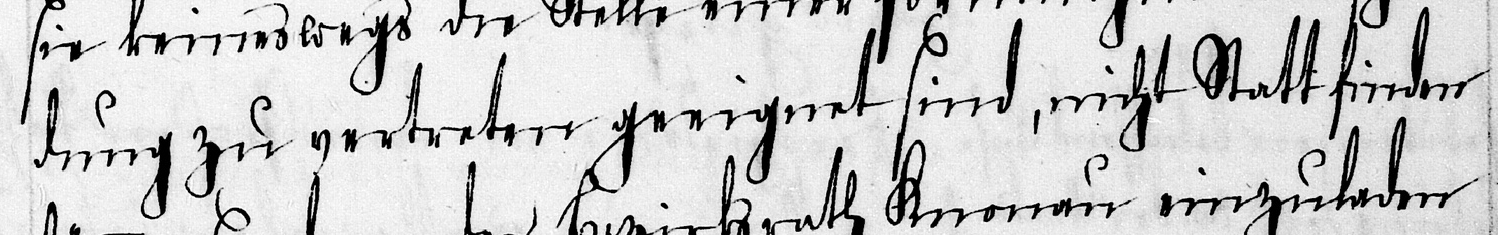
dung zu vertreten geeignet sind, nicht Statt finden
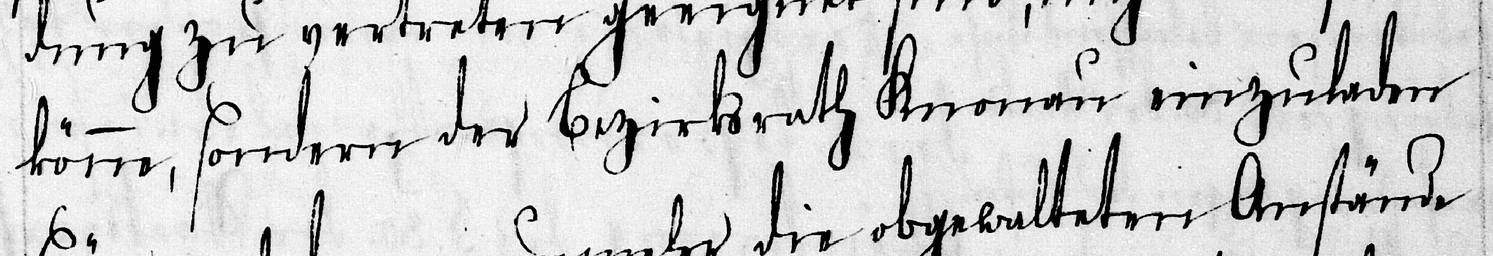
könne, sondern der Bezirksrath Knonau einzuladen
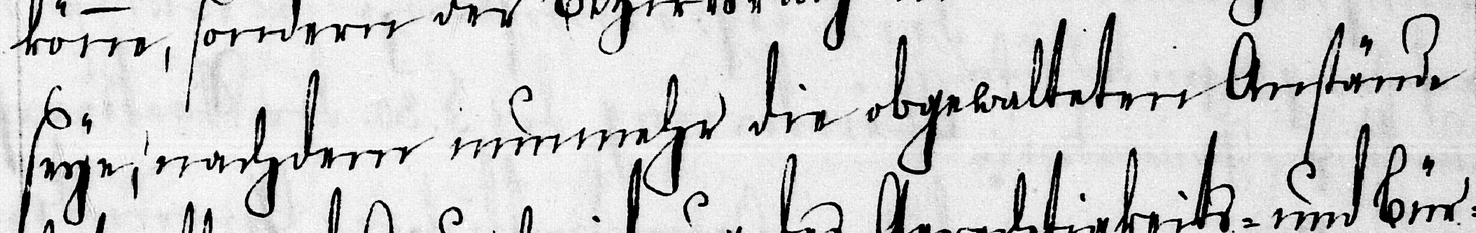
seye, nachdem nunmehr die obgewalteten Anstände
